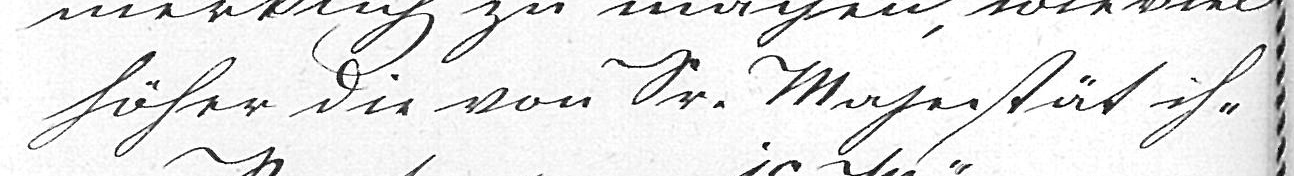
höher die von Sr. Majestät ih-
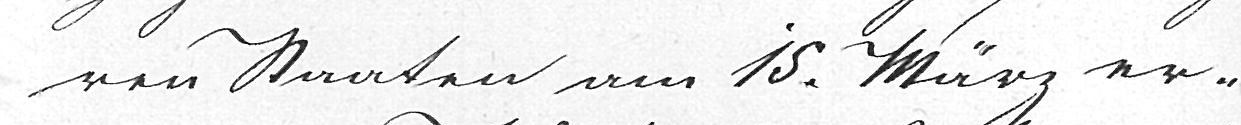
ren Staaten am 15. März er-
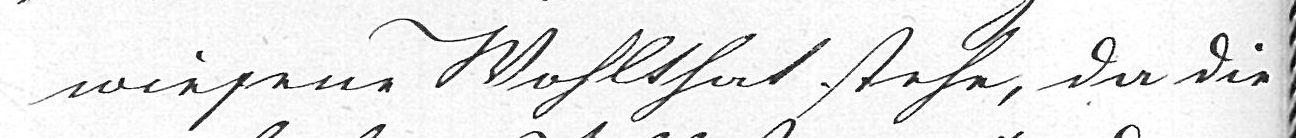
wiesene Wohlthat stehe, da die
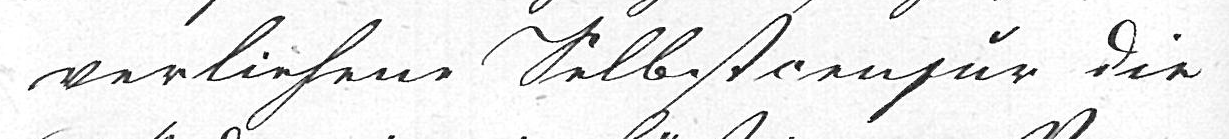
verliehene Selbstcensur die
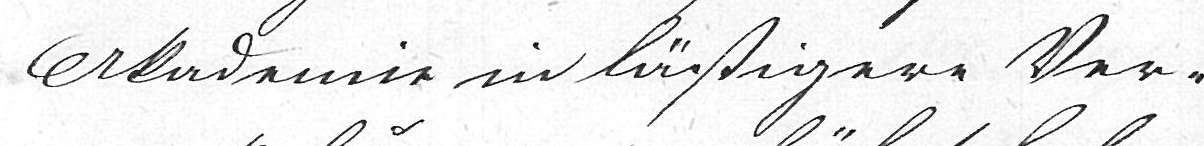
Akademie in lästigere Ver-
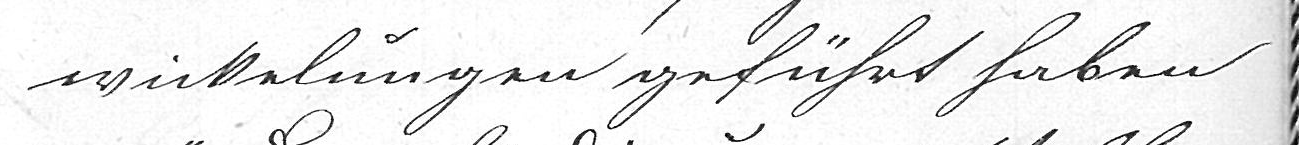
wickelungen geführt haben
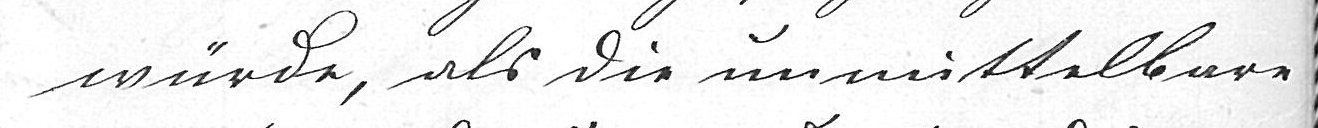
würde, als die unmittelbare
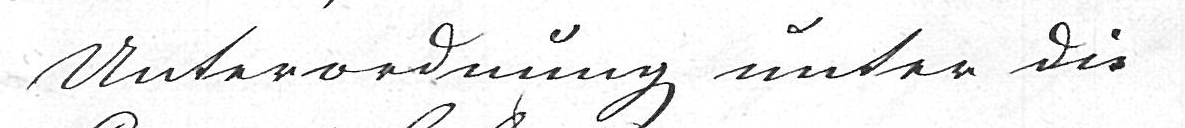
Unterordnung unter die
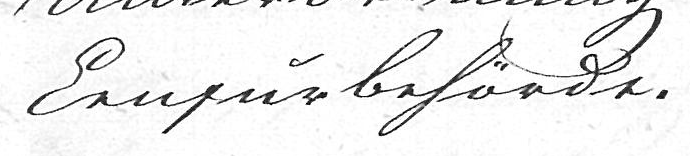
Censurbehörde.
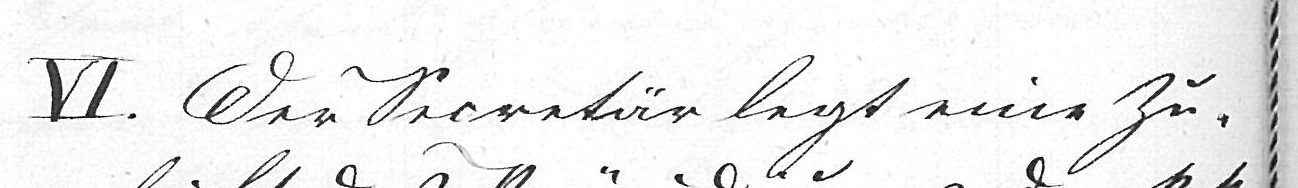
VI. Der Sercetär legt eine Zu-
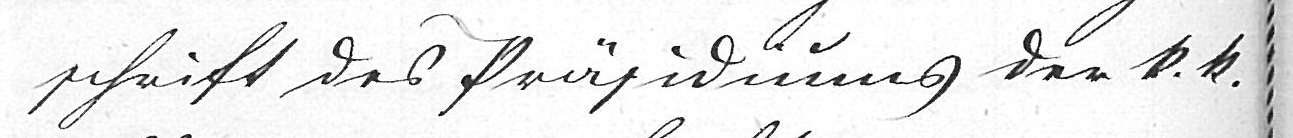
schrift des Präsidiums der k.k.
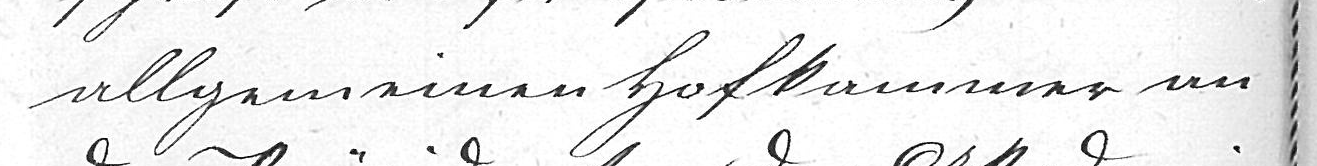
allgemeinen Hofkammer an
